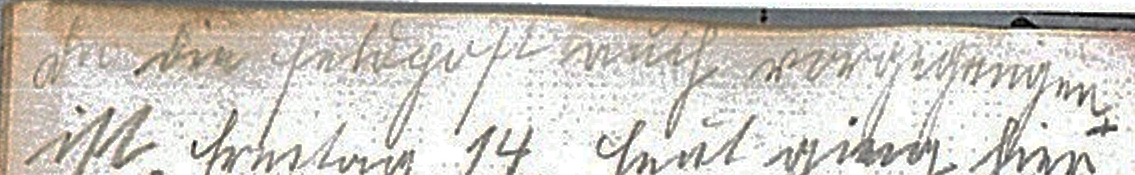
da die Feldpost auch vorgegangen
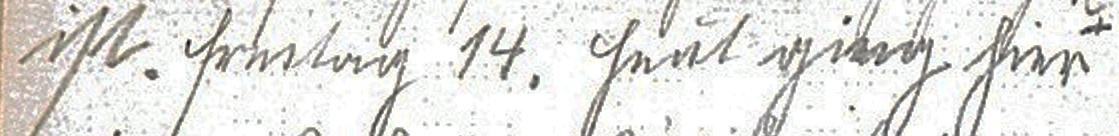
ist. Freitag 14. Heut ging hier
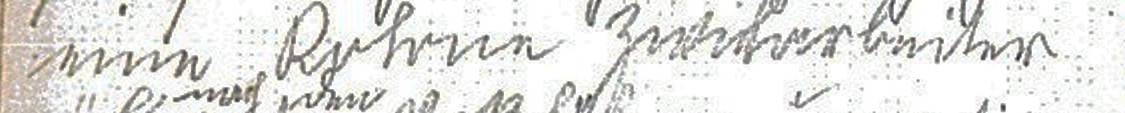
eine Rohxxx Zuxxarbeiter
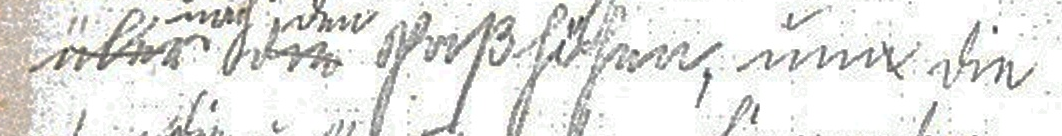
nach den Großhöhen,um die
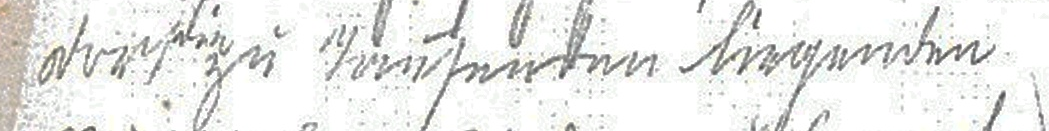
dort die zu Tausenden liegenden
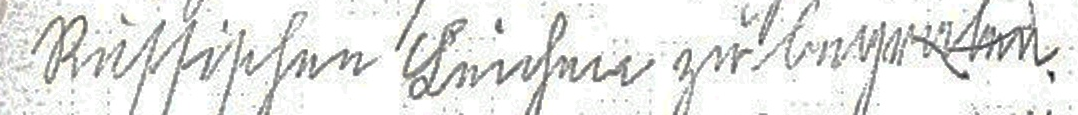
Russischen Leichen zu begraben.
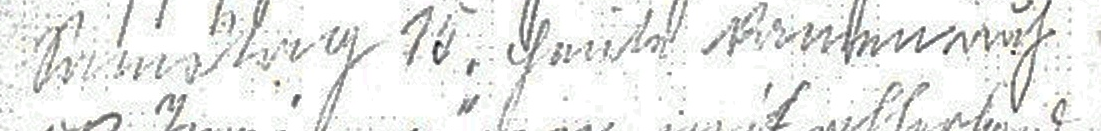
Samstag 15. heute kamen auch
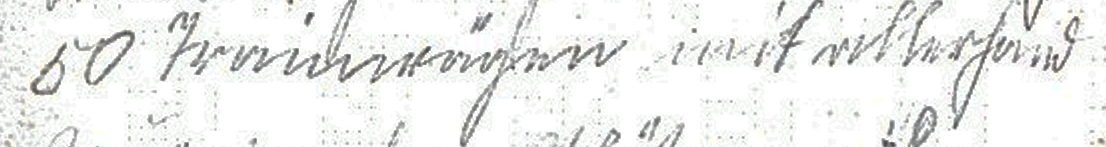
50 Trainwägen mit allerhand
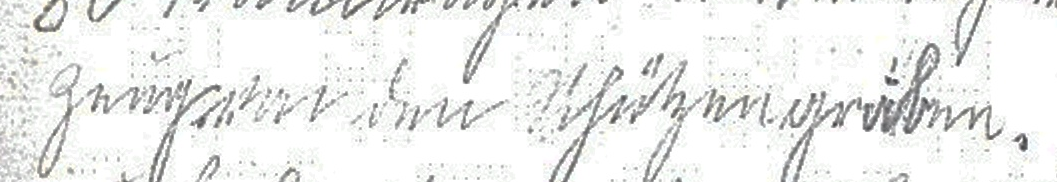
Zeug xx.xx den Schützengräben.
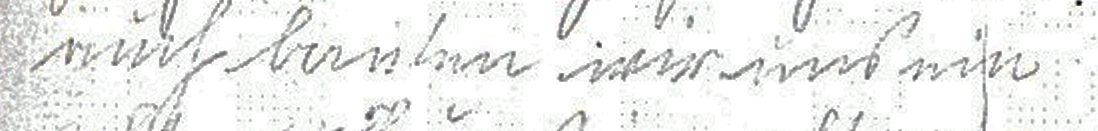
auch bru??ten wir uns ein
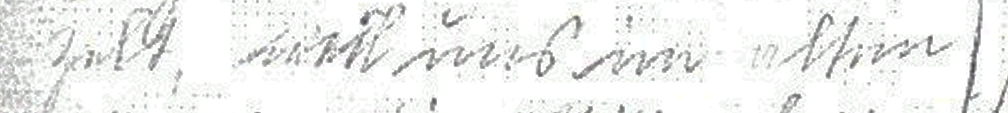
zelt,weil uns im alten
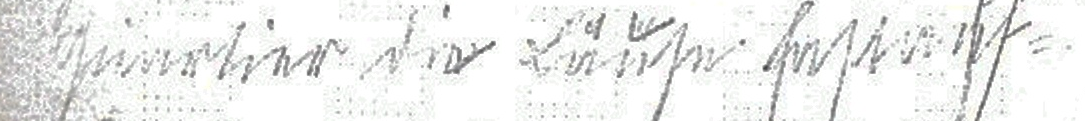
Quartier die Läuse fast auf=
